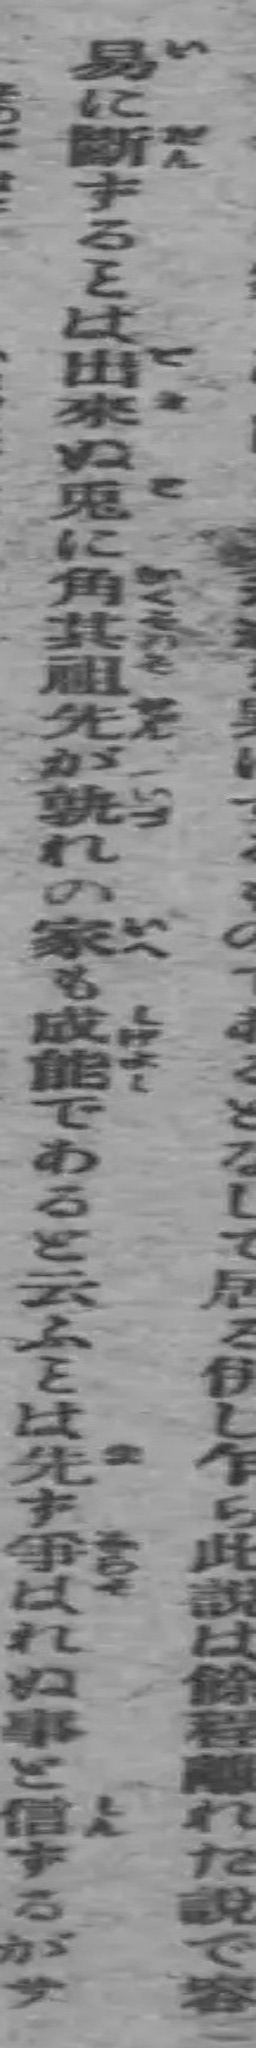易に断ずることは出来ぬ兎に角其祖先が孰れの家も成能であると云ふことは先ず争はれぬ事と信ずるがサ
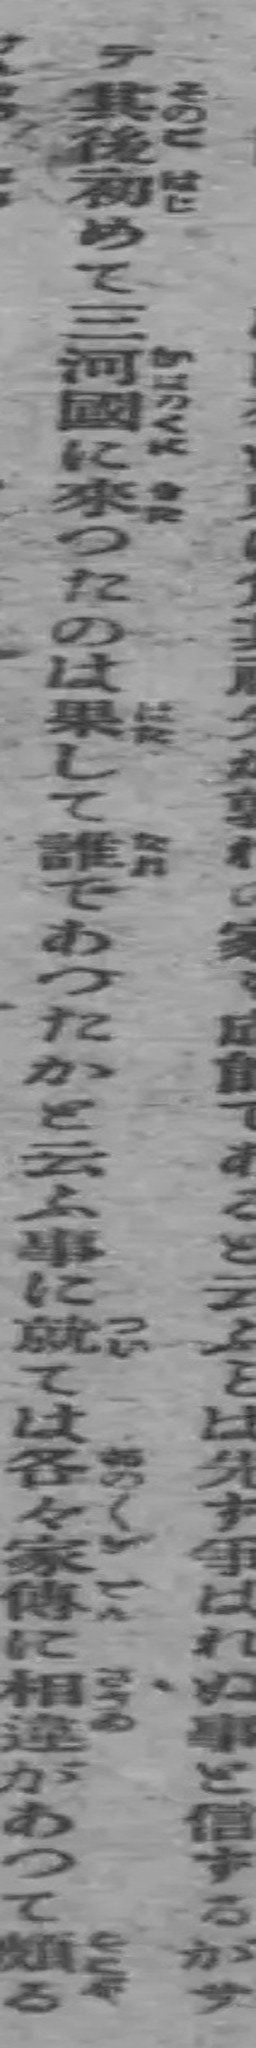テ其後初めて三河国に来つたのは果して誰であつたかと云ふ事に就ては各々家伝に相違があつて頗る
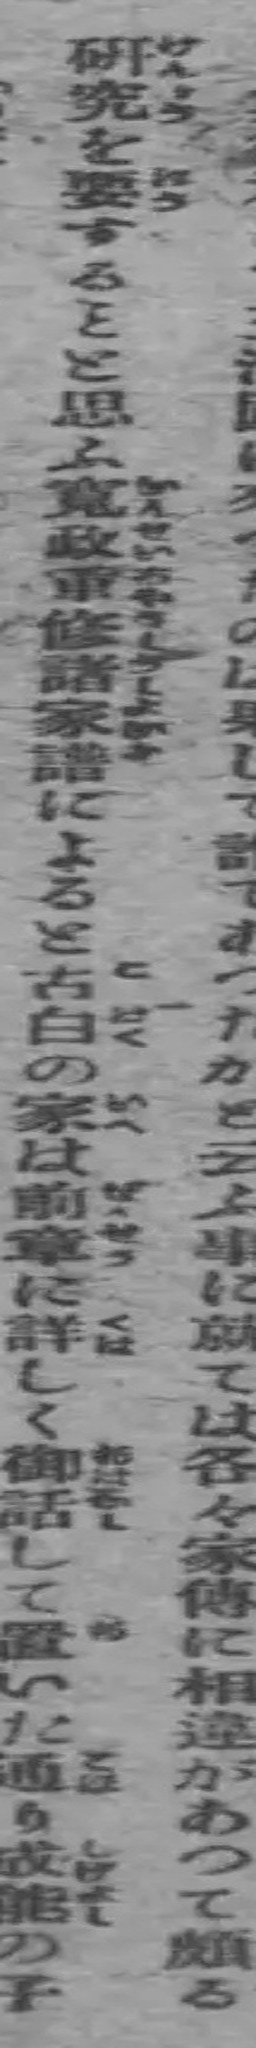研究を要することと思ふ寛政重修諸家譜によると古白の家は前章に詳しく御話して置いた通り成能の子
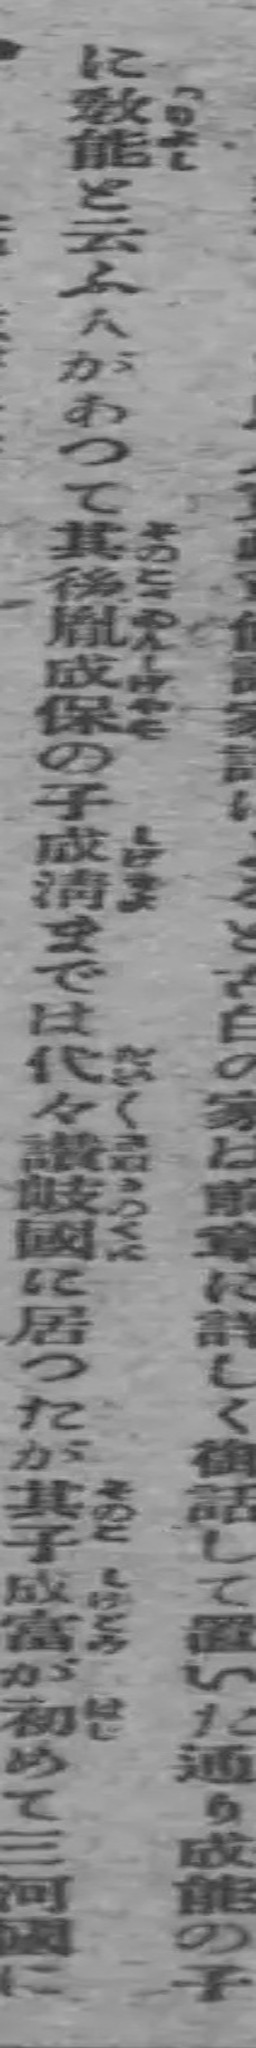に教能と云ふ人があつて其後胤成保の子成清までは代々讃岐国に居つたが其子成富が初めて三河国に
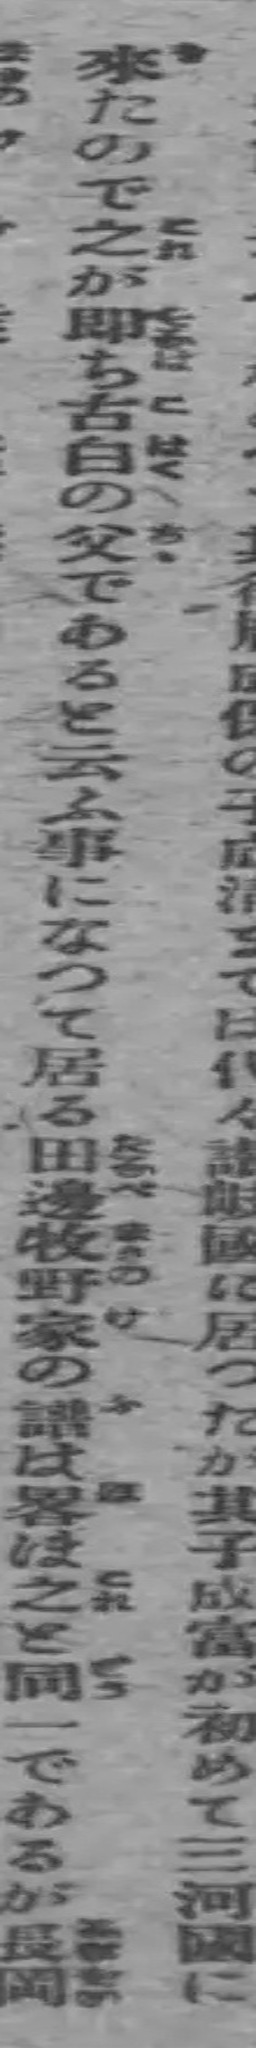来たので之が即ち古白の父であると云ふ事になつて居る田邉牧野家の譜は略ほ之と同一であるが長岡
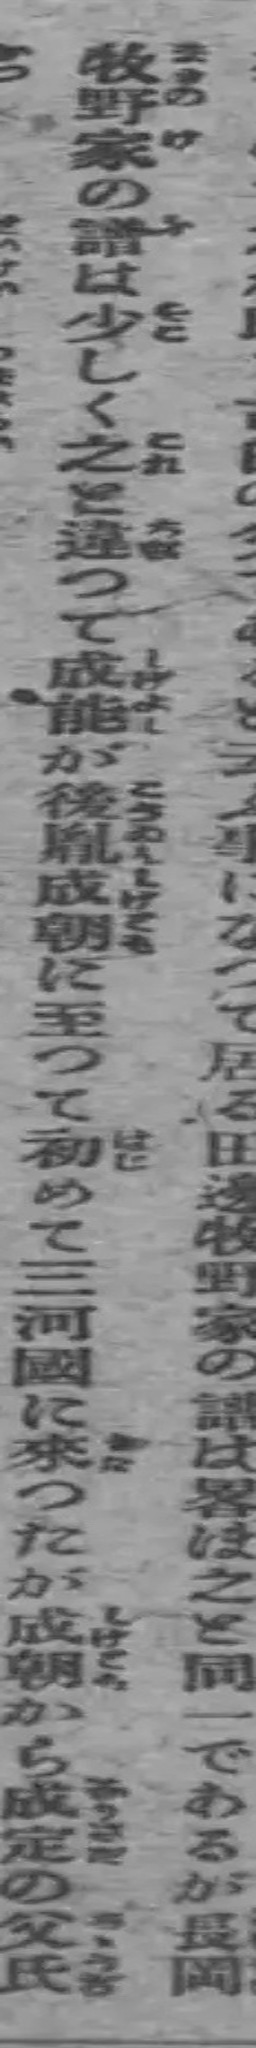牧野家の譜は少しく之と違つて成能が後胤成朝に至つて初めて三河国に来つたが成朝から成定の父氏
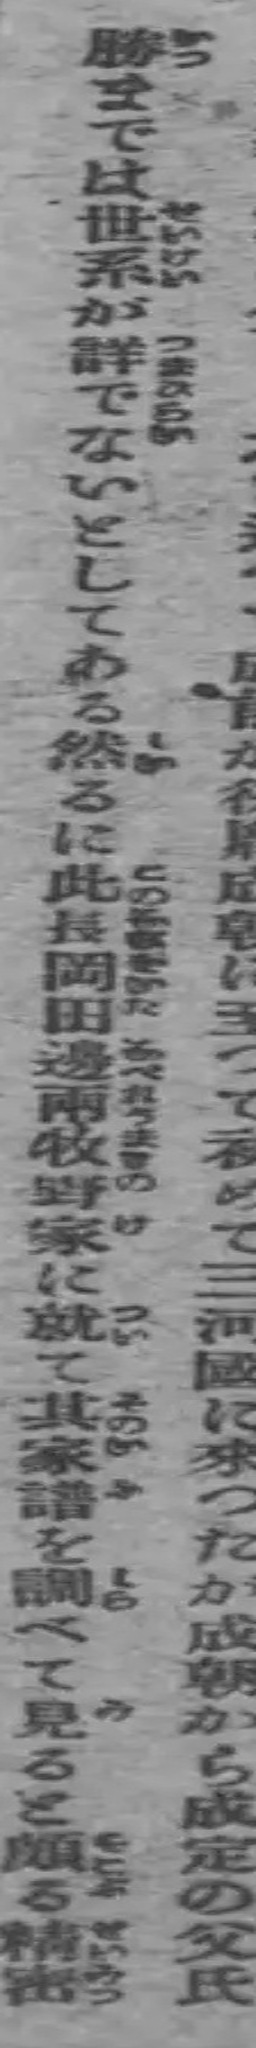勝までは世系が詳でないとしてある然るに此長岡田邉両牧野家に就て其家譜を調べて見ると頗る精密
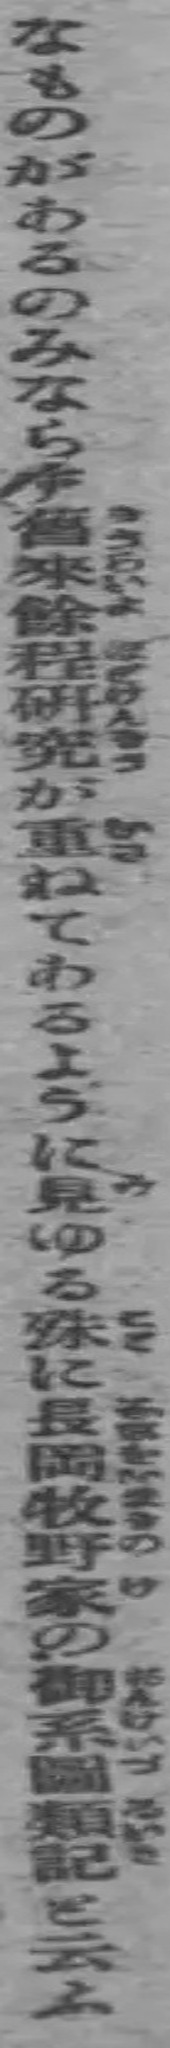なものがあるのみならず旧来余程研究が重ねてあるように見ゆる殊に長岡牧野家の御系図類記と云ふ
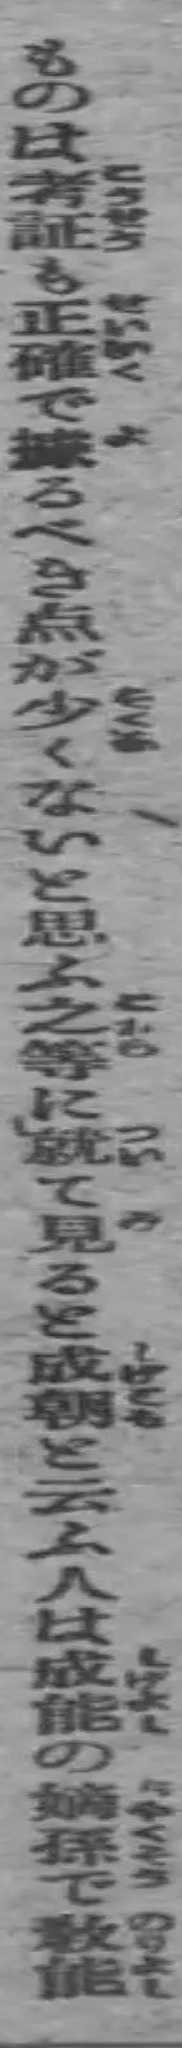ものは考証も正確で拠るべき点が少くないと思うふ之等に就て見ると成朝と云ふ人は成能の嫡孫で教能
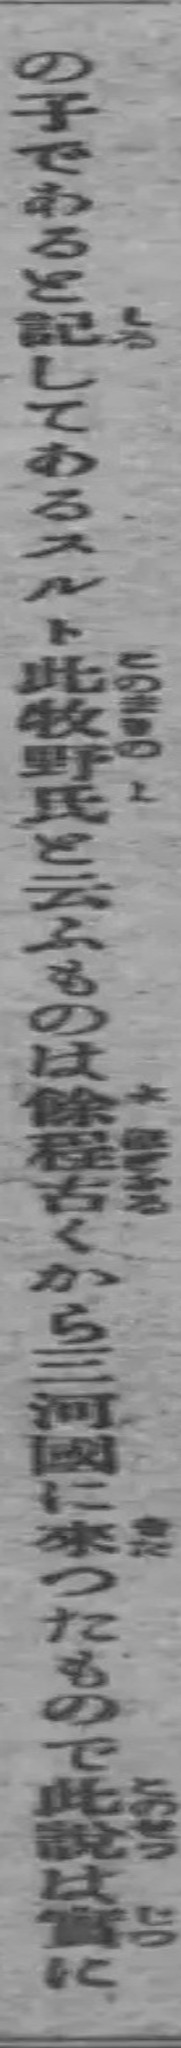の子であると記してあるスルト此牧野氏と云ふものは余程古くから三河国に来つたもので此説は実に
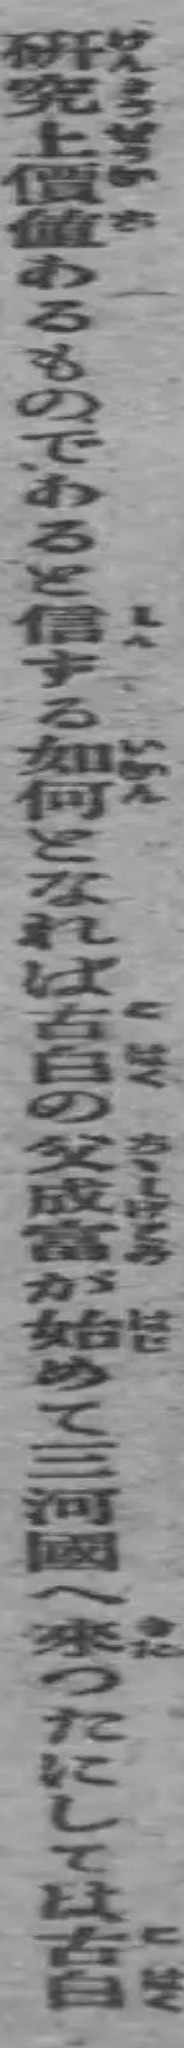研究上価値あるものであると信ずる如何となれば古白の父成富が始めて三河国へ来つたにしては古白
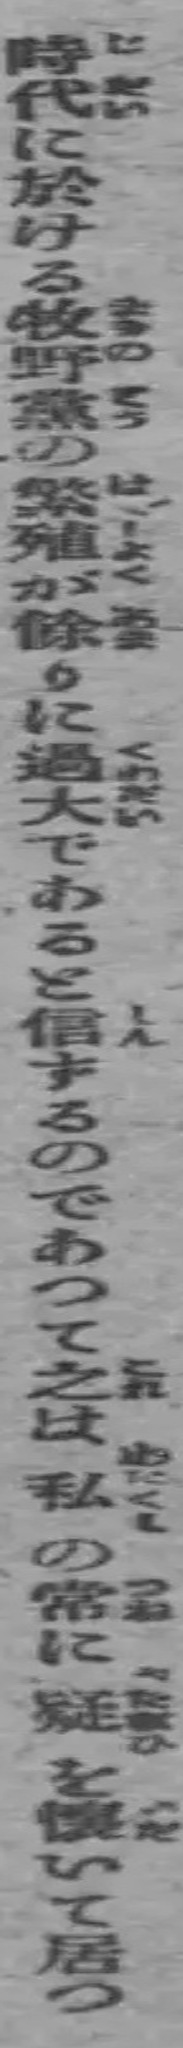時代に於ける牧野党の繁殖が余りに過大であると信ずるのであつて之は私の常に疑を懐いて居つ
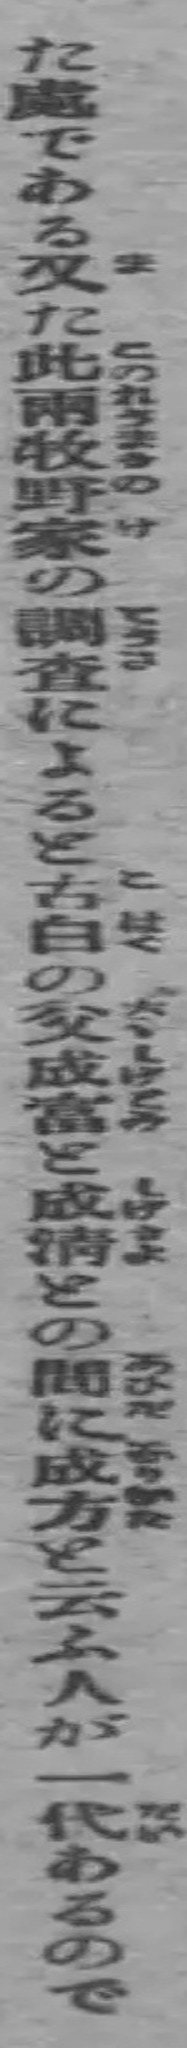た処である又た此両牧野家の調査によると古白の父成富と成清との間に成方と云ふ人が一代あるので
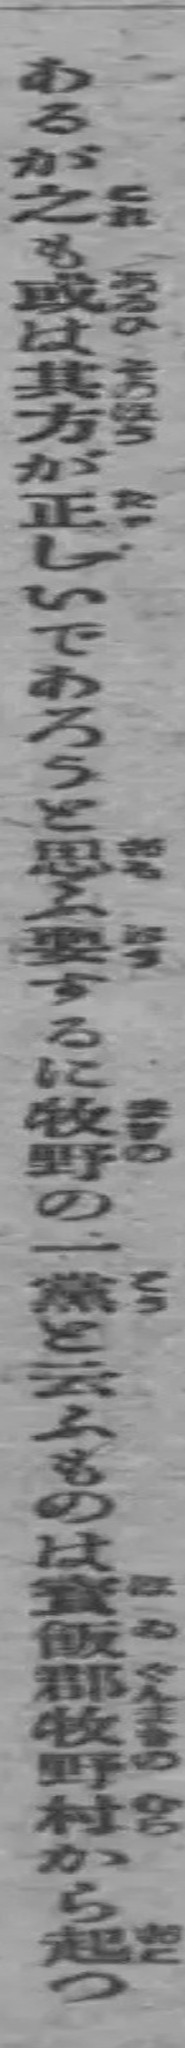あるが之も或は其方が正しいであろうと思ふ要するに牧野の一党と云ふものは宝飯郡牧野村から起つ
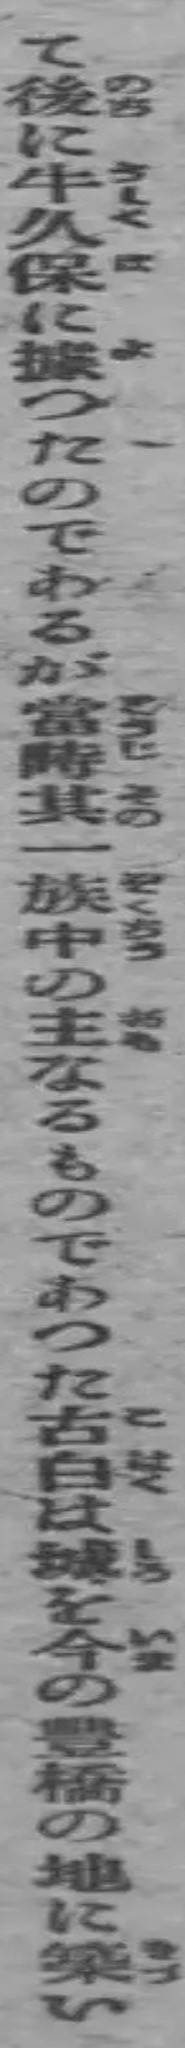て後に牛久保に拠つたのであるが当時其一族中の主なるものであつた古白は城を今の豊橋の地に築い
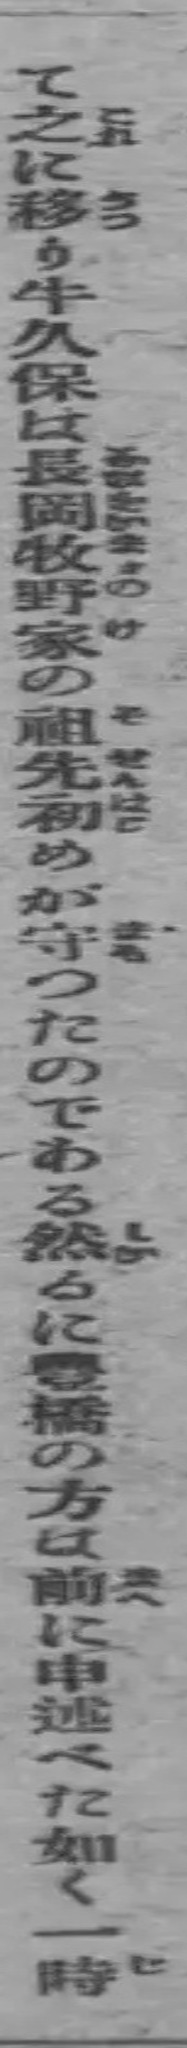て之に移り牛久保は長岡牧野家の祖先初めが守つたのである然るに豊橋の方は前に申述べた如く一時
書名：豊橋市史談
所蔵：国立国会図書館 National Diet Library, JAPAN
